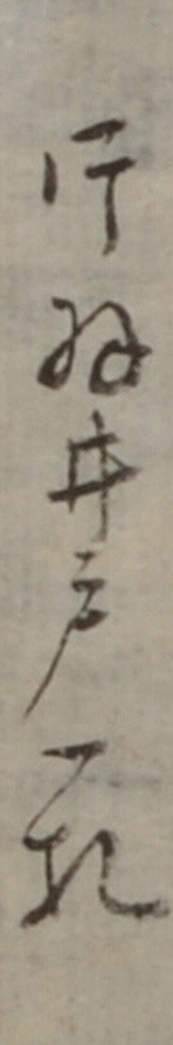上片羽井戸一札
